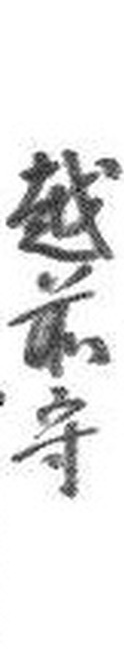越前守
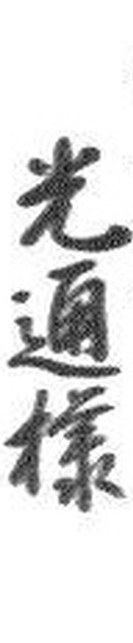光通様
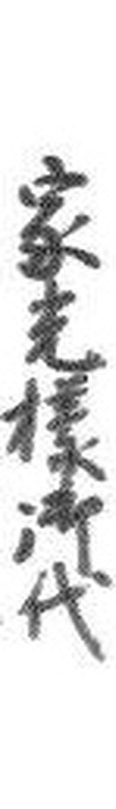家光様御代
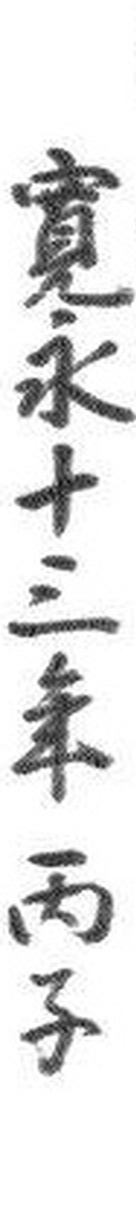寛永十三年丙子
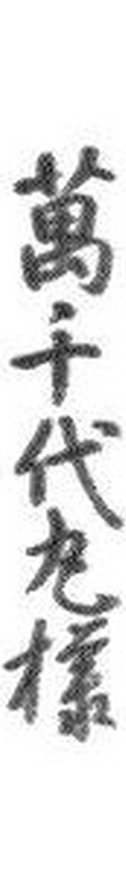萬千代丸様

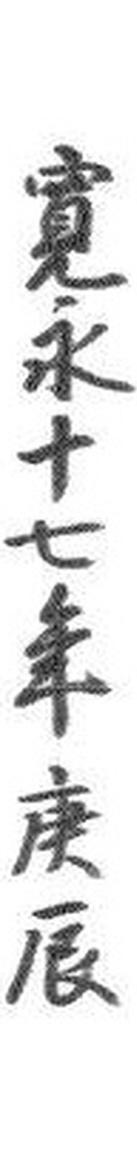寛永十七年庚辰

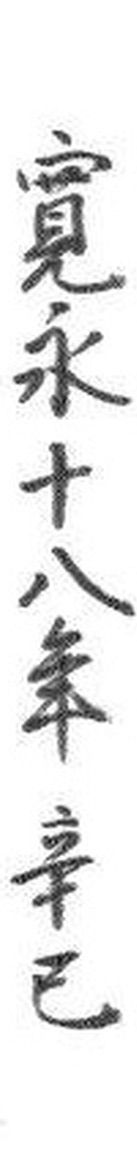寛永十八年辛巳
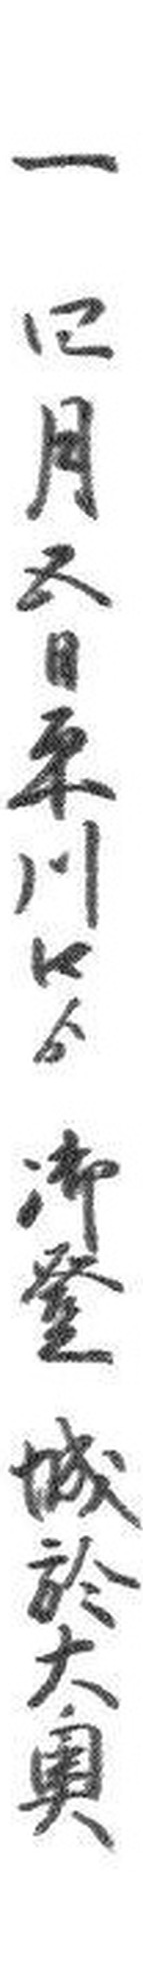一四月五日平川口ゟ御登城於大奥
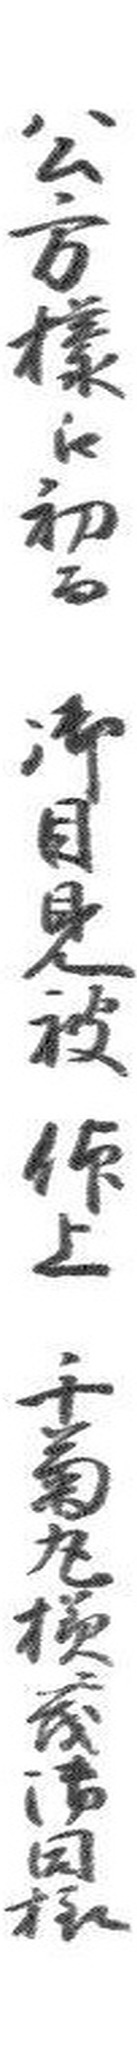公方様江初而御目見被仰上千菊丸様ニ茂御同様
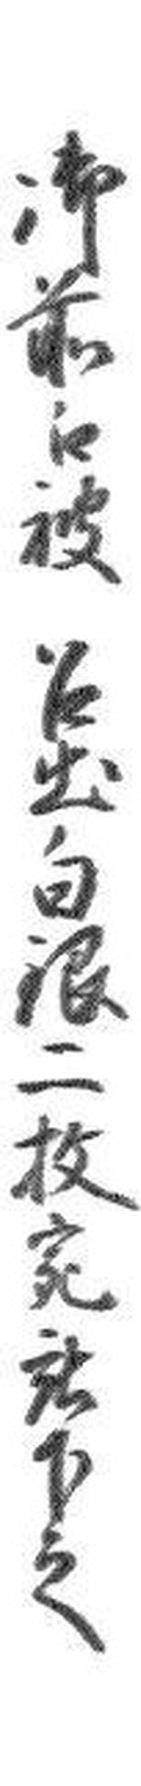御前江被召出白銀二枚宛被下之
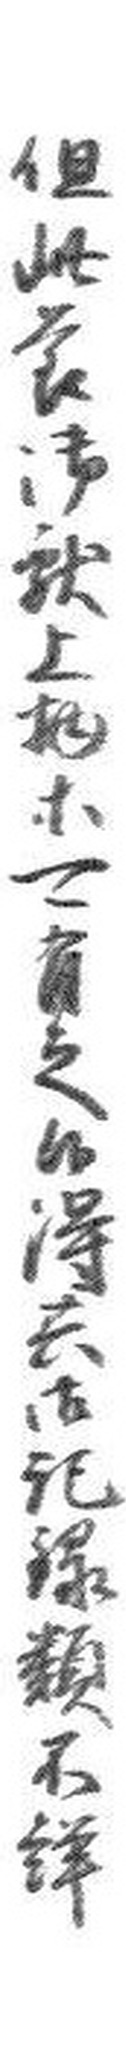但此節御献上物等可有之候得共御記録類不詳

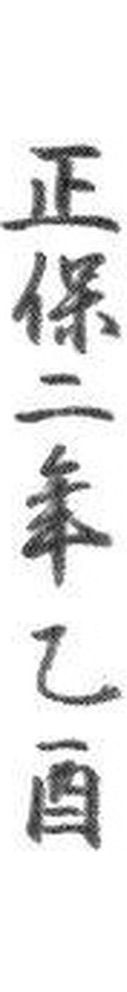正保二年乙酉
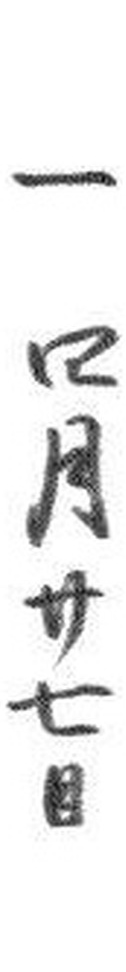一四月廿七日
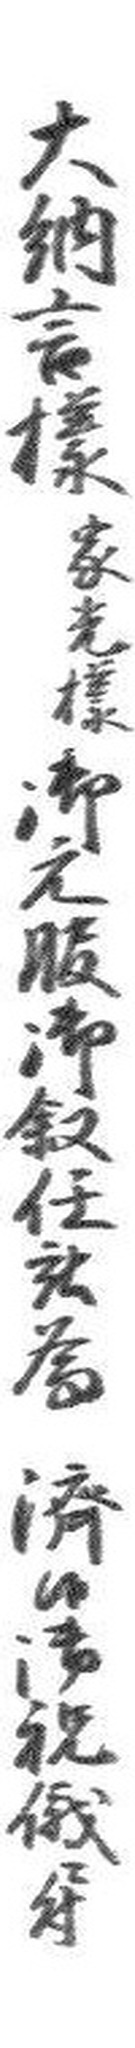大納言様家光様御元服御叙任被為済候御祝儀ニ付
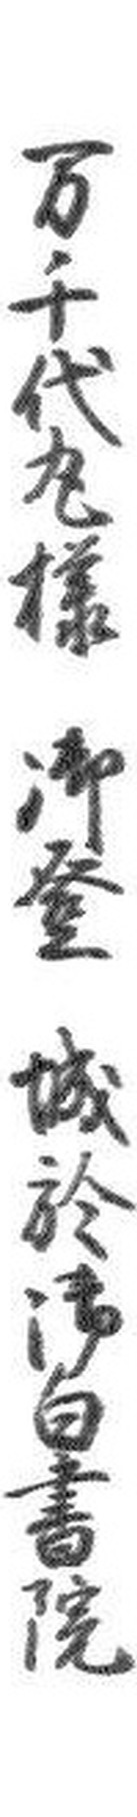万千代丸様御登城於御白書院
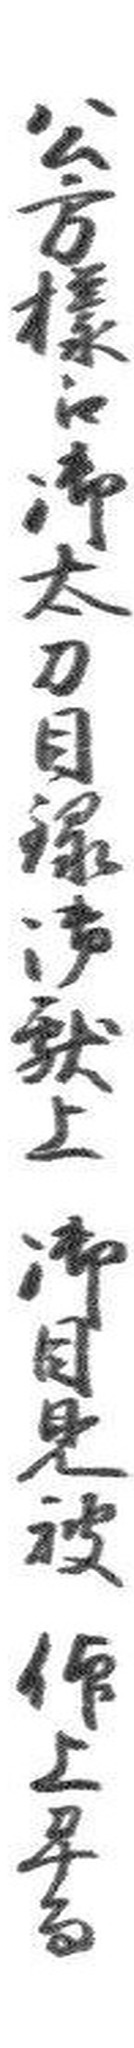公方様江御太刀目録御献上御目見被仰上畢而
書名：家譜 五 光通公 従寛永十三年到万治二年
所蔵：福井県文書館 Fukui Prefectural Archives
